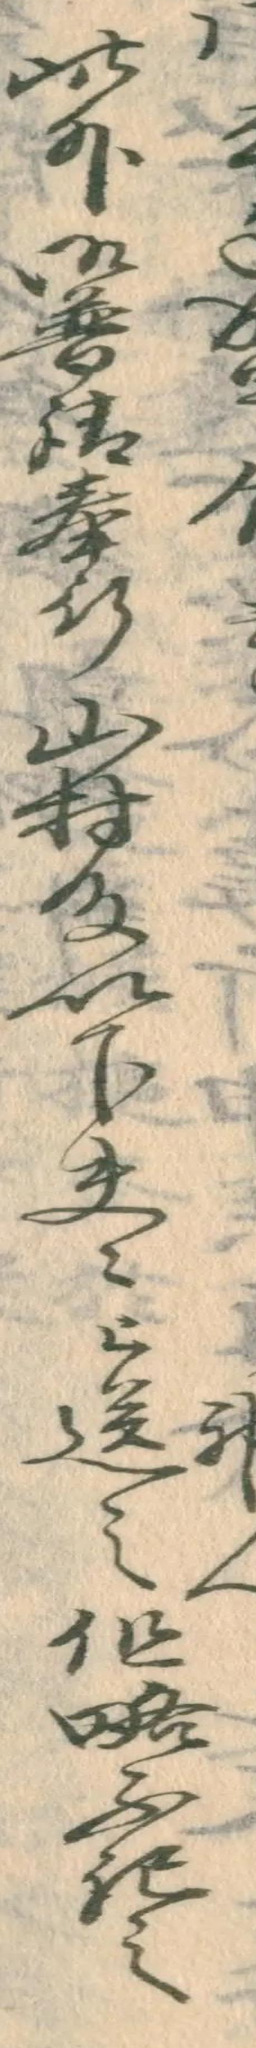此外御普請奉行山村殿以下夫々被送之但略不記之
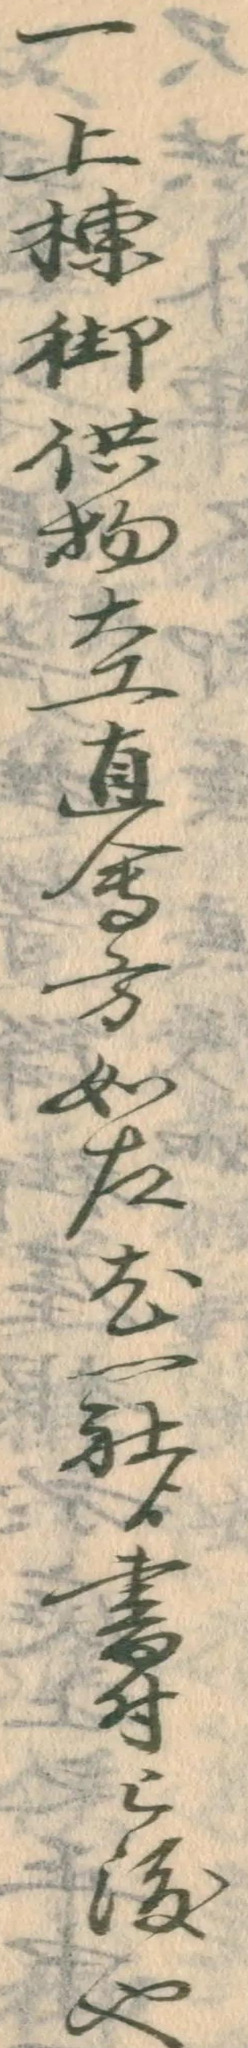一上棟御供物大工直会方如左尤一社ゟ書付被渡
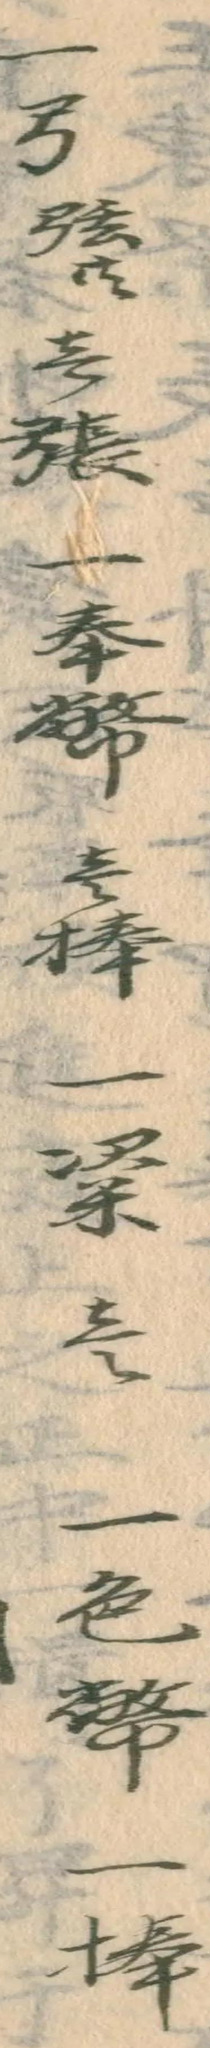一弓弦共壱張一奉幣壱捧一粢壱一色幣一捧
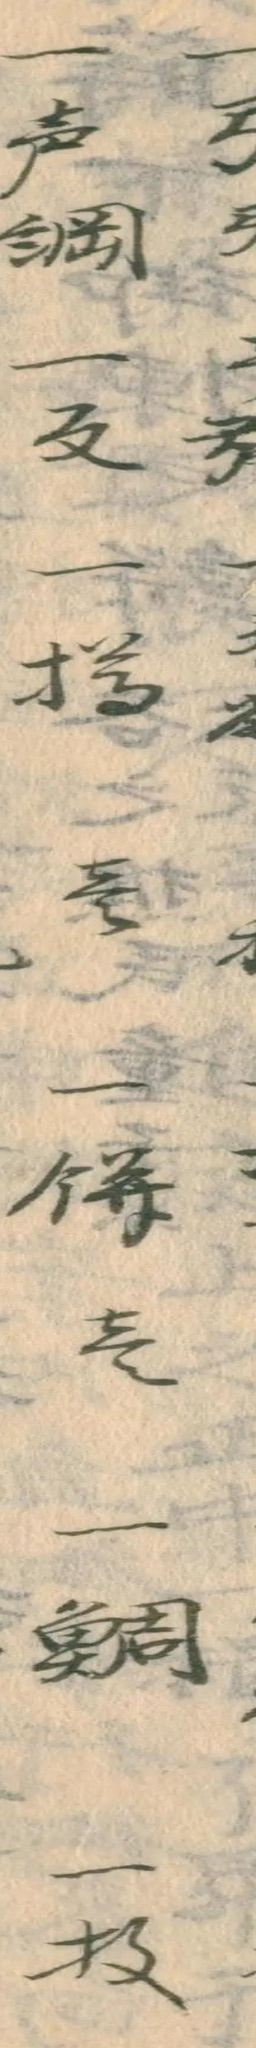一声綱一反一樽壱一餅壱一鯛一枚
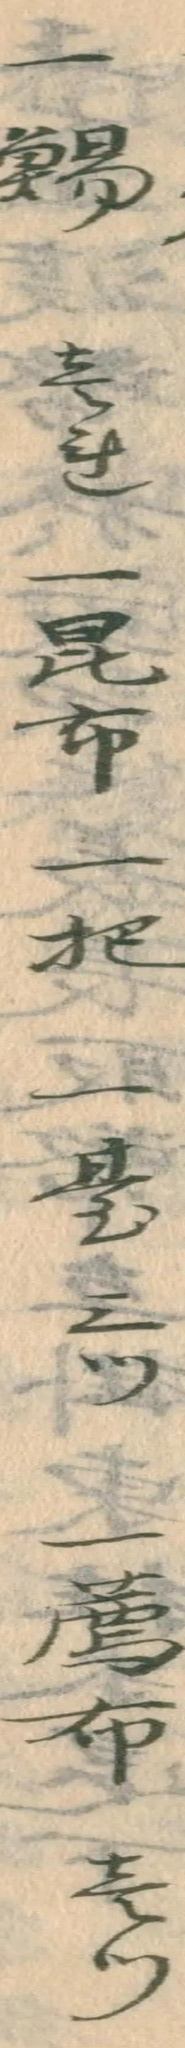一鯣壱連一昆布一把一台三ツ一薦布壱ツ
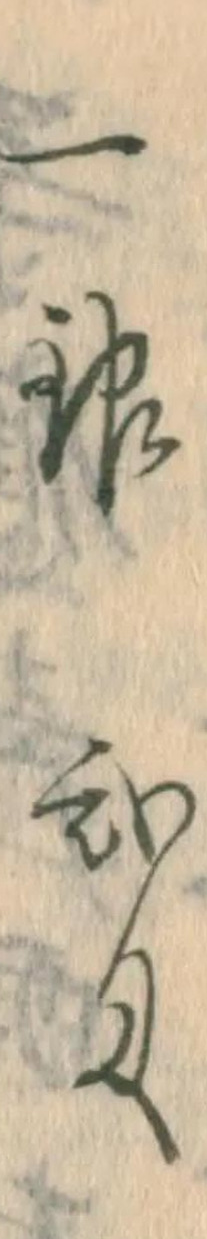一銀弐匁
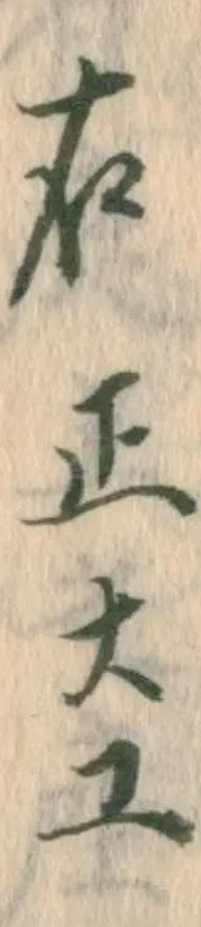右正大工
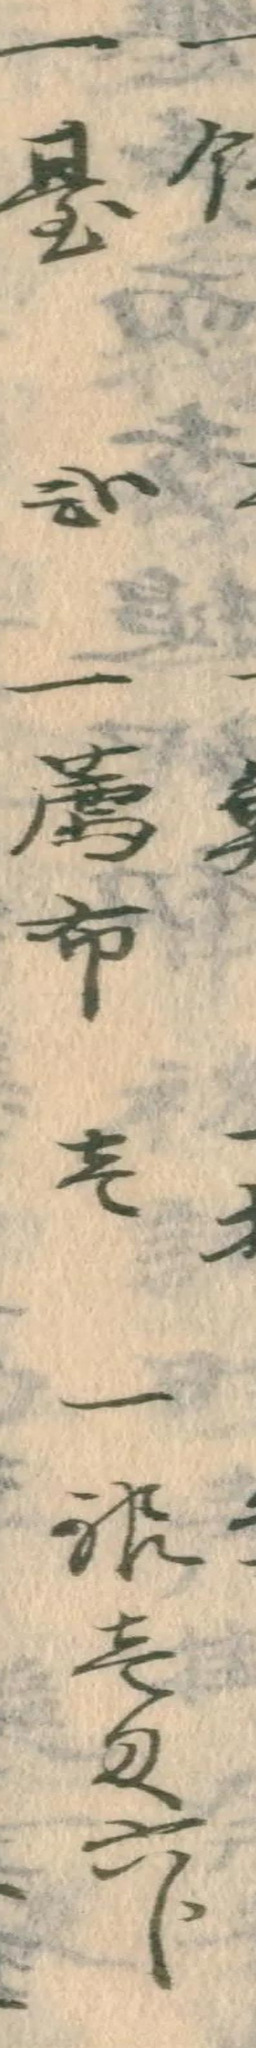一台弐一薦布壱一銀壱匁六分
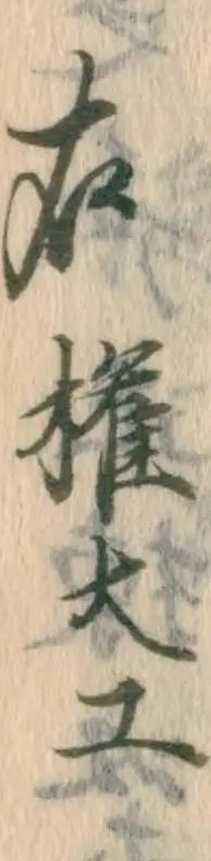右権大工
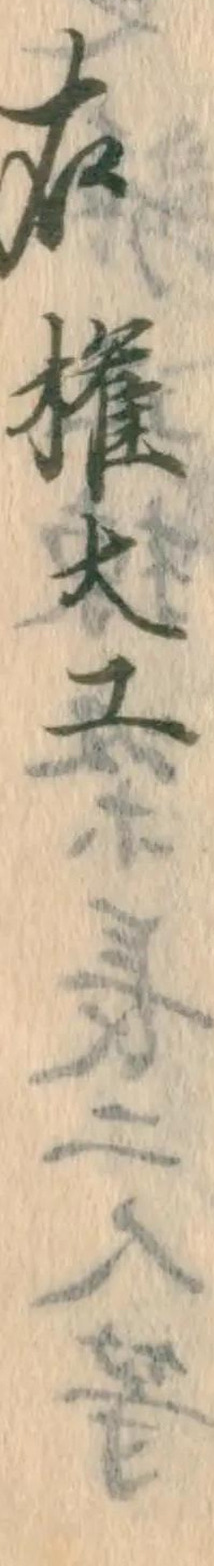右権大工
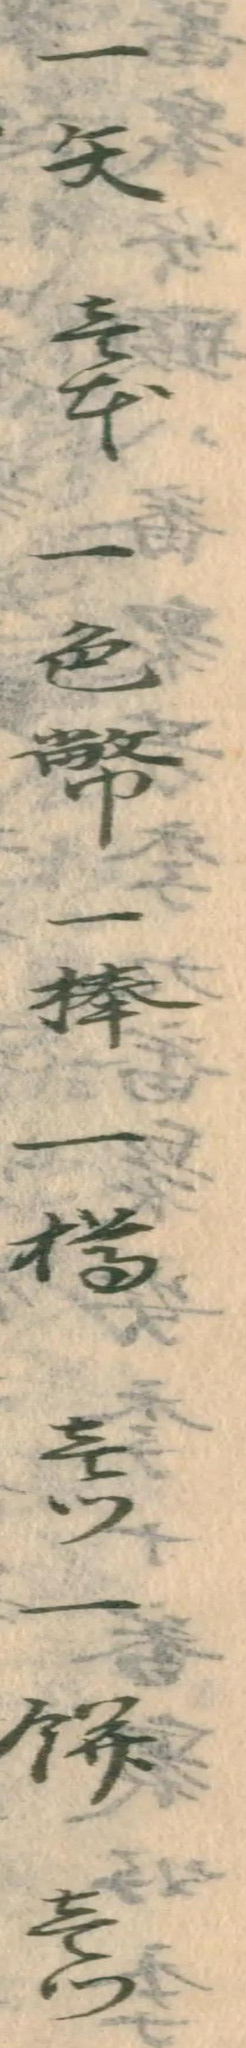一矢壱本一色幣一捧一樽壱ツ一餅壱ツ
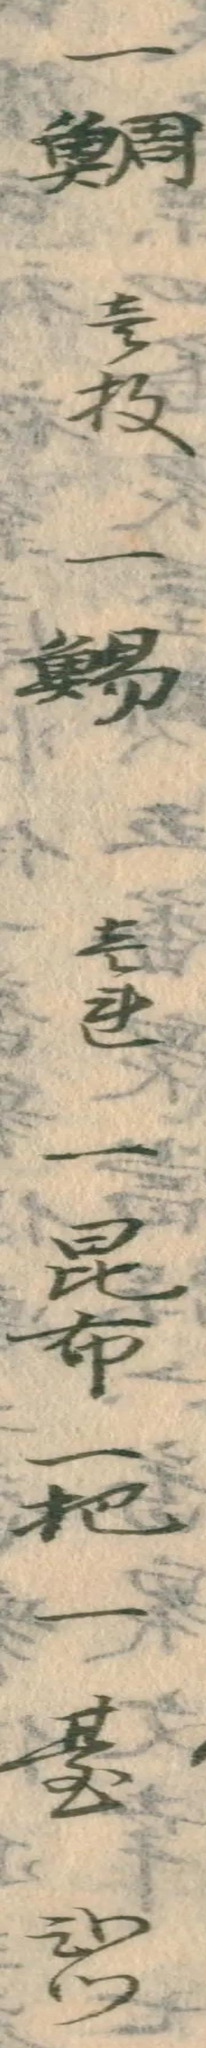一鯛壱枚一錫壱連一昆布一把一台弐ツ
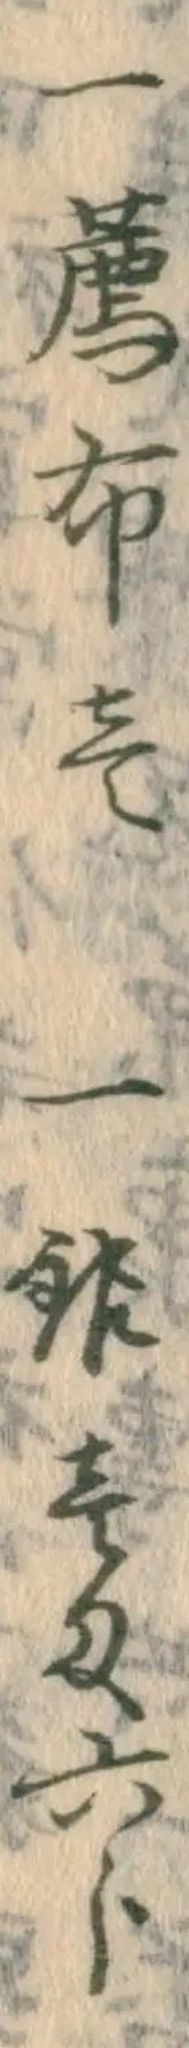一薦布壱一銀壱匁六分
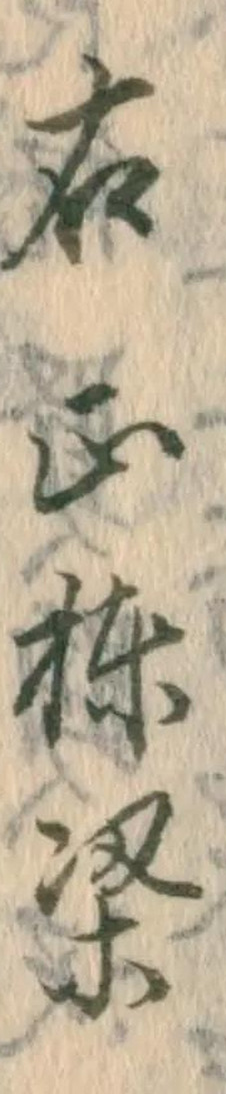右正棟梁
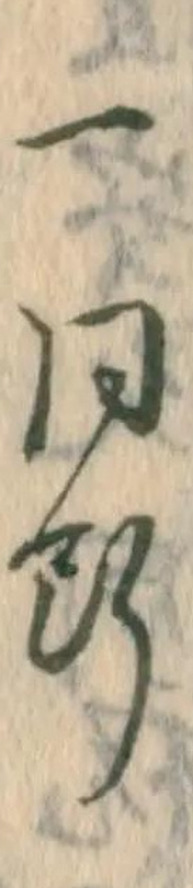一同断
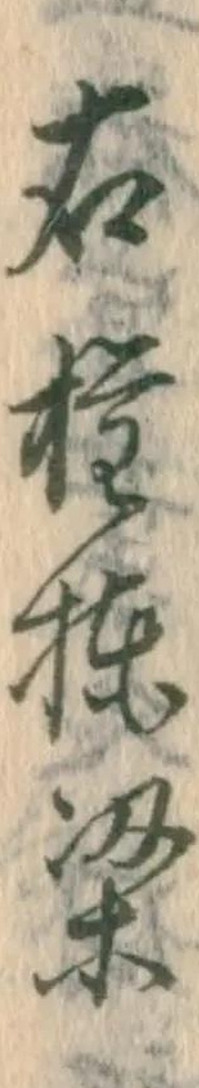右正棟梁
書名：賀茂社記録. 第17冊
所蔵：国立国会図書館 National Diet Library, JAPAN
